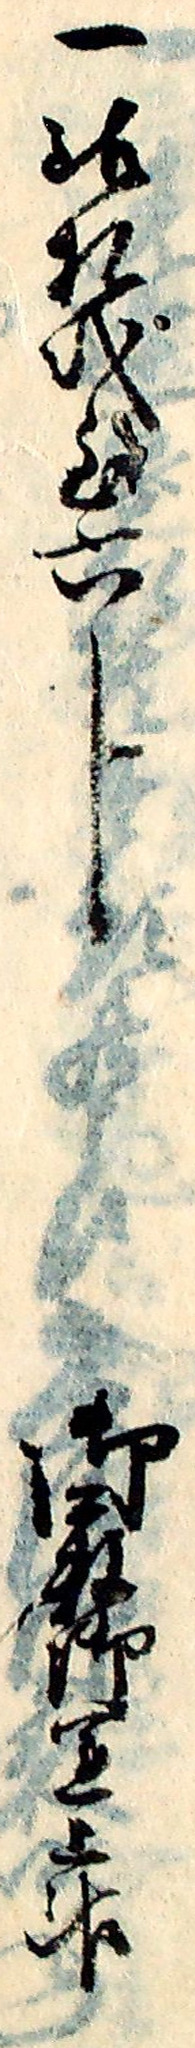一銀拾弐匁六分御藪御運上銀
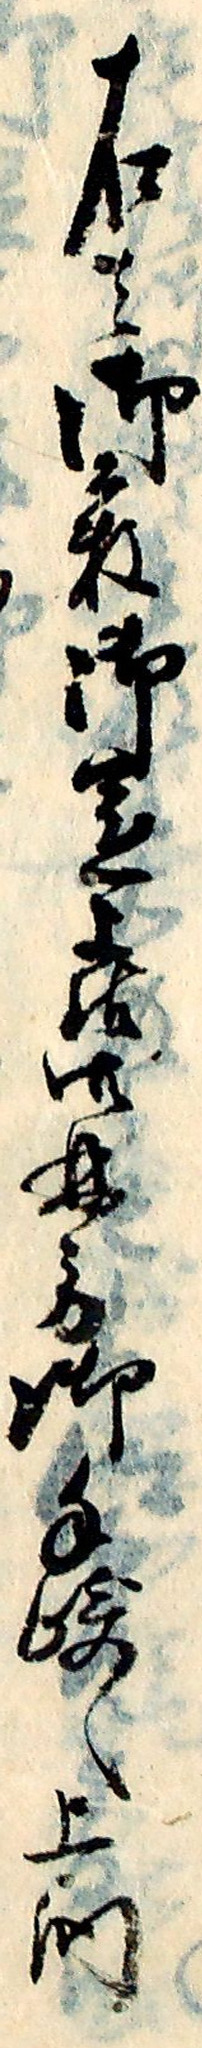右は御藪御運上銀御林方御手崎へ上納
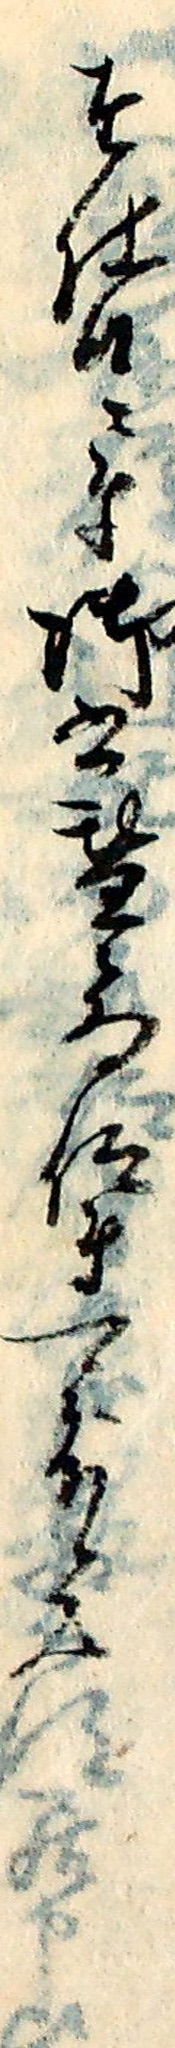奉仕候に付御書替被為仰付可被下候以上
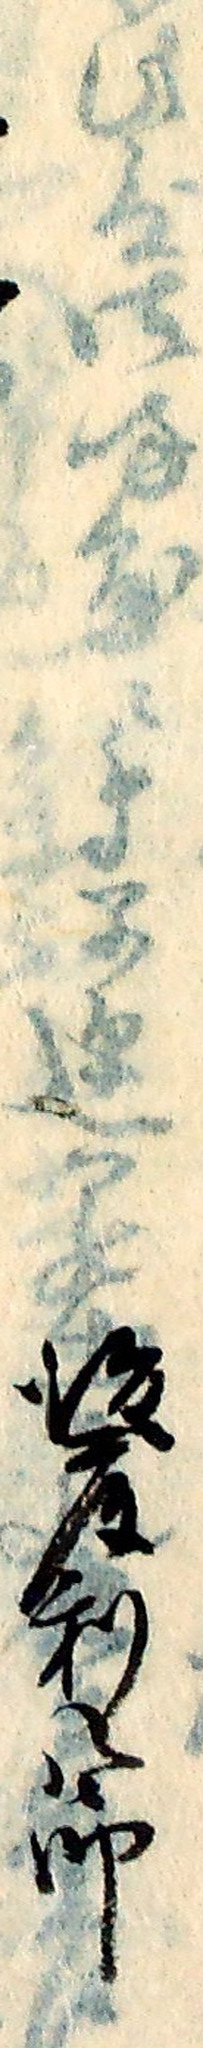後藤利八郎
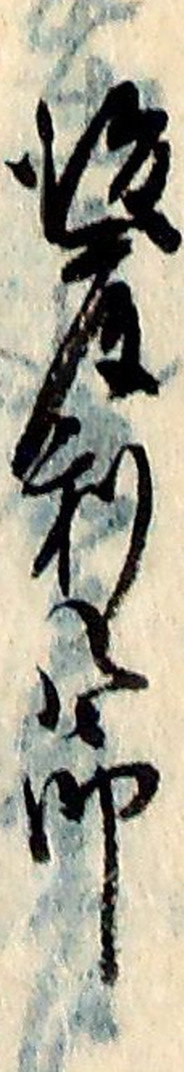後藤利八郎
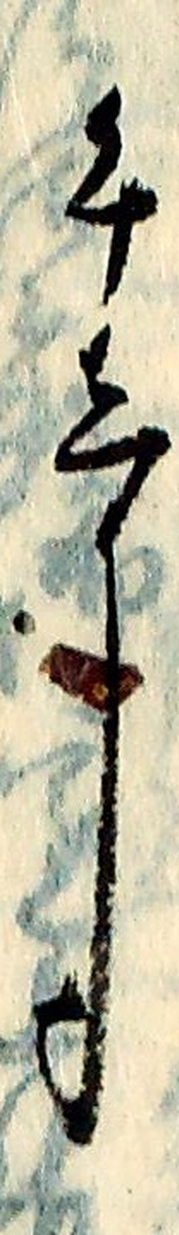午十二月
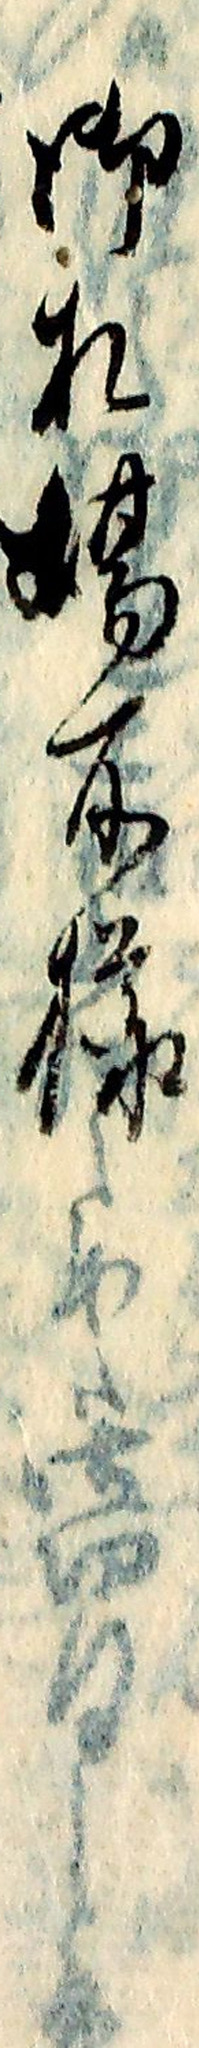御札場所様
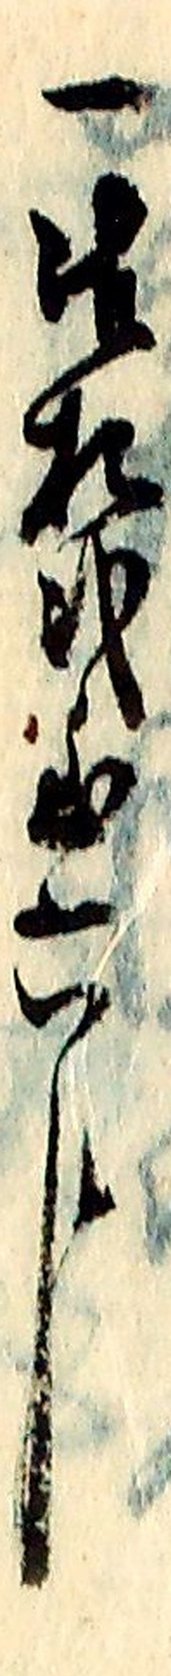一銀拾弐匁六分
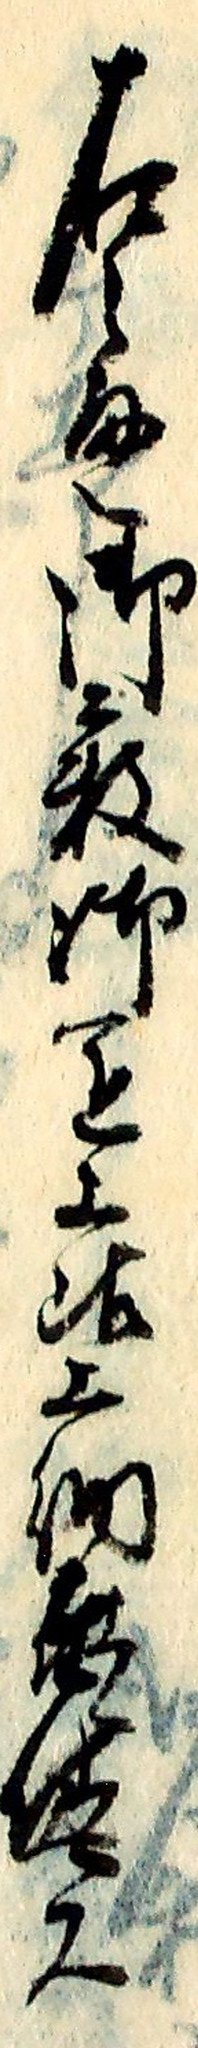右之通御藪御運上銀上納奉仕候
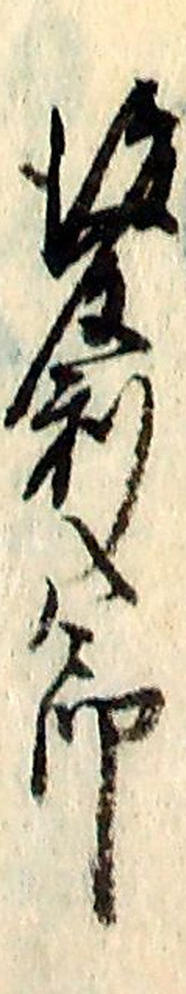後藤利八郎
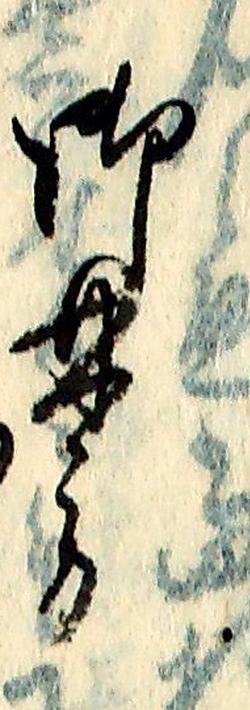御林方
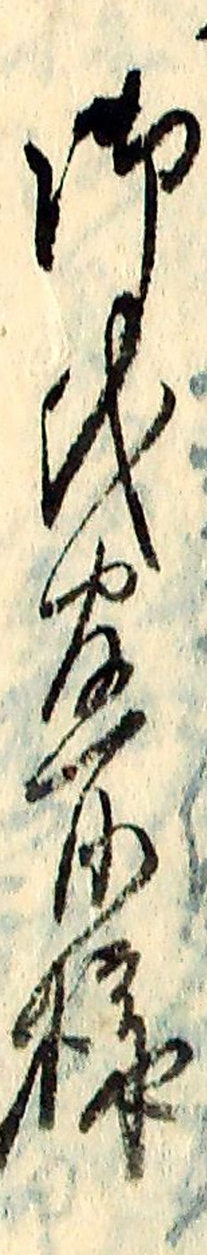御代官所様
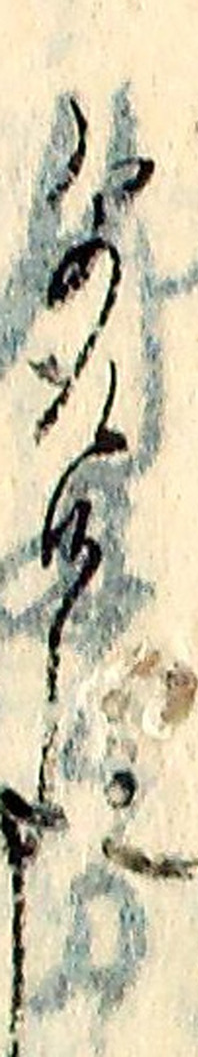受取候事
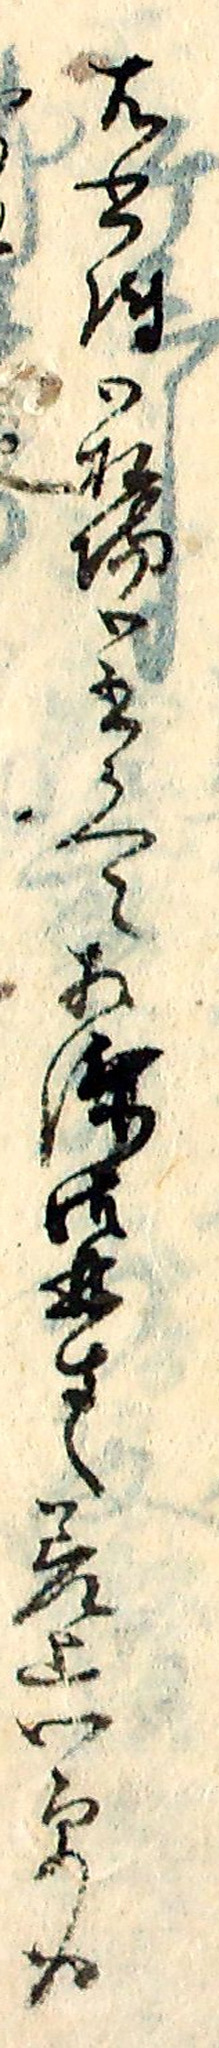右書附御札場御書かへに相添御林方へ差上御受取
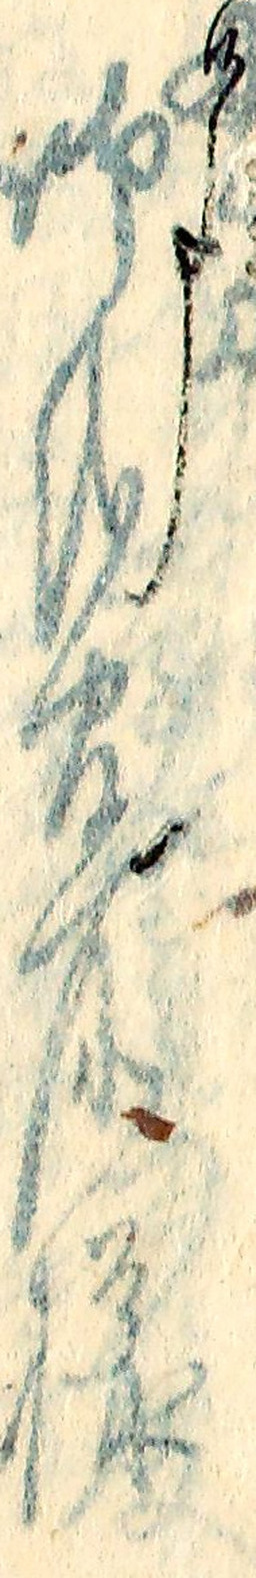御代官所様

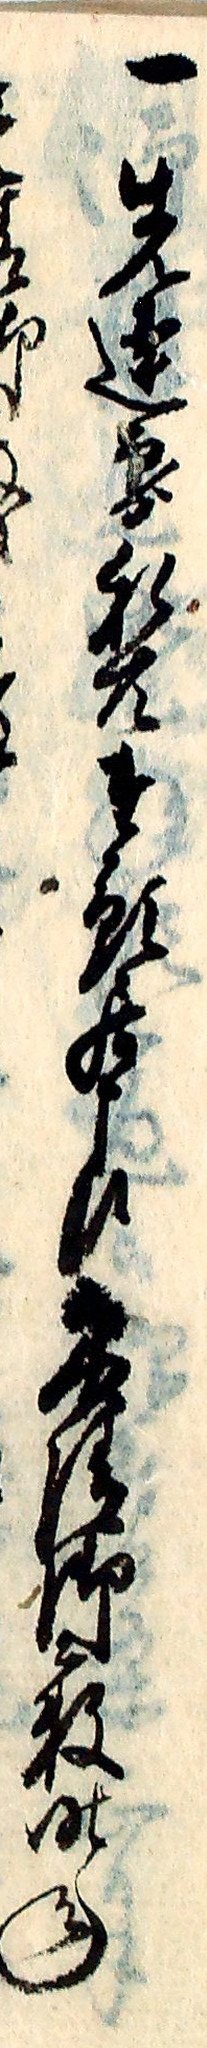一先達てゟ私共奉願居申候束請御藪昨年
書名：諸御願書控(後藤氏壱番）
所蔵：鳴門教育大学 Naruto University of Education
